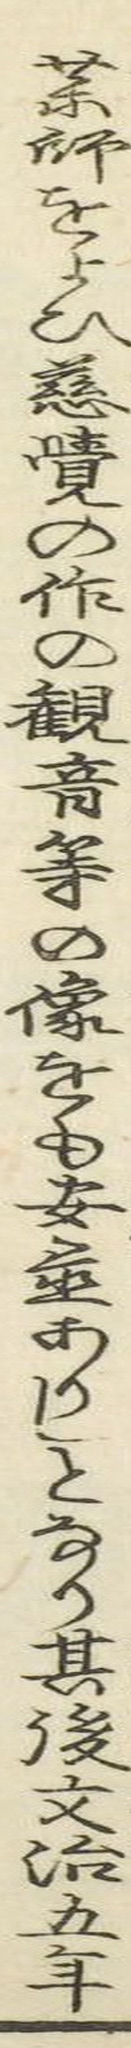薬師をよひ慈覚の作の観音等の像をも安置ありしとなり其後文治五年
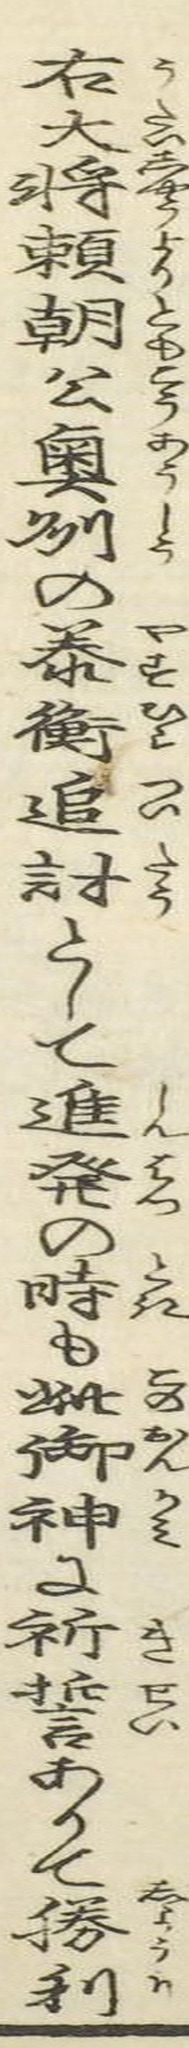右大将頼朝公奥州の泰衡追討として進発の時も此御神に祈誓ありて勝利
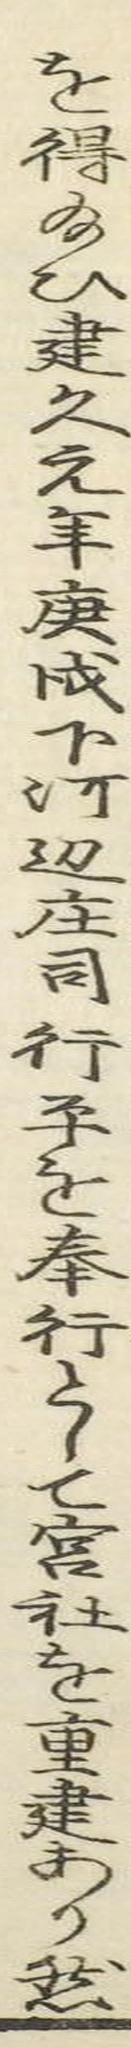を得給ひ建久元年庚戌下河辺庄司行平を奉行として宮社を重建あり然
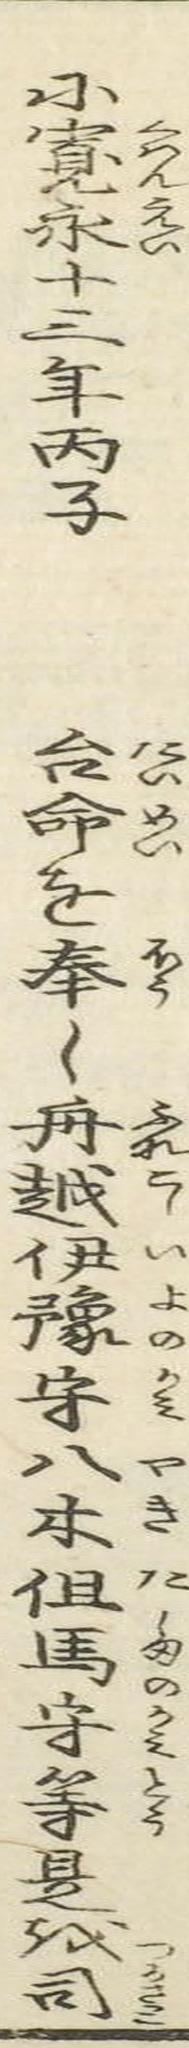に寛永十三年丙子台命を奉し船越伊予守八木但馬守等是を司
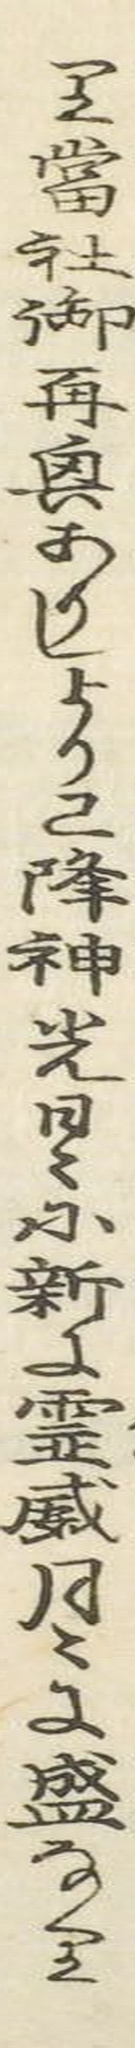り当社御再興ありしよりこの已降神光日々に新に霊威月々に盛なり
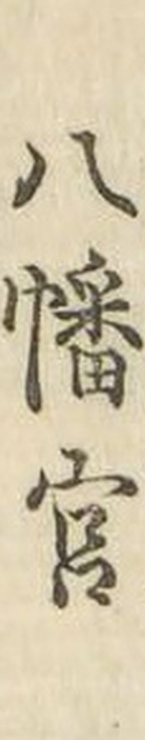八幡宮
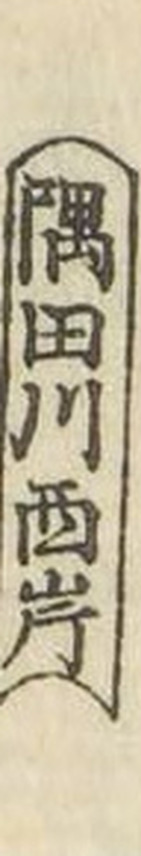隅田川西岸

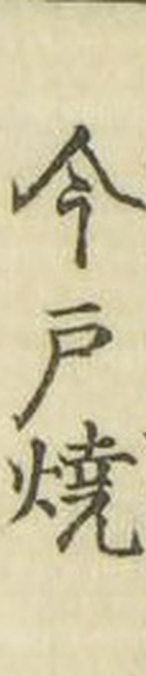今戸焼
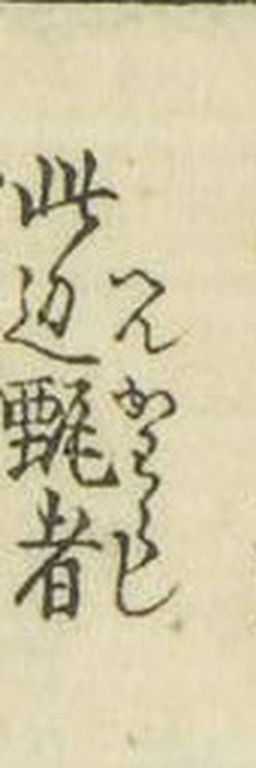此辺甄者
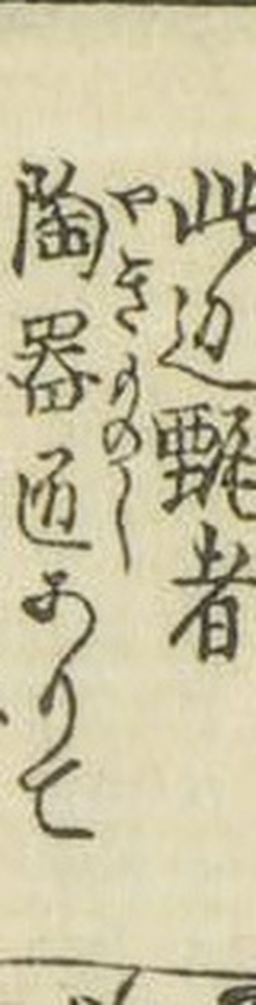陶器匠ありて
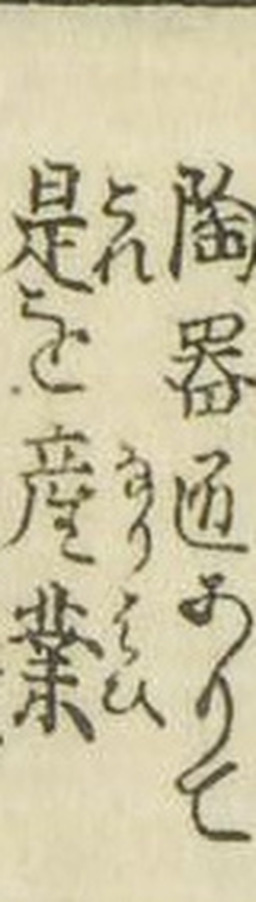是を産業
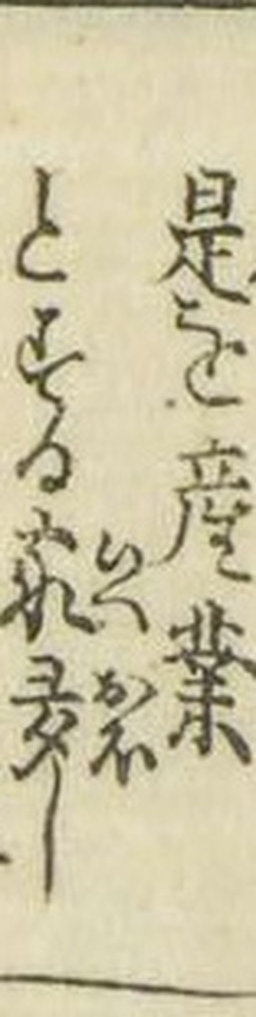とする家多し
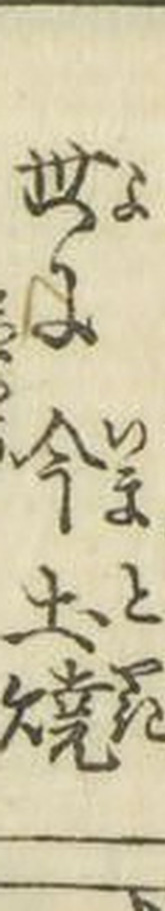世に今土焼
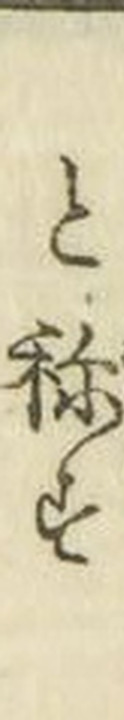と称す
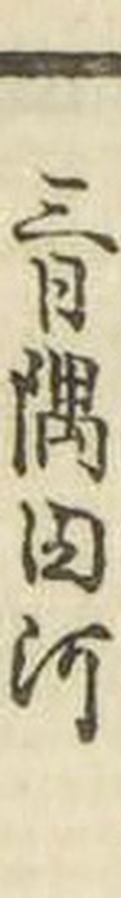三日隅田河
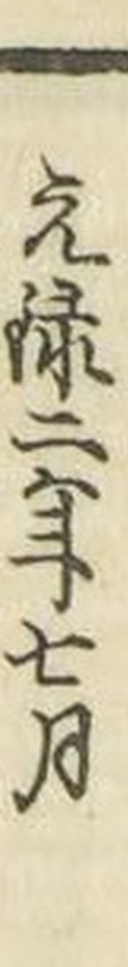元禄二年七月
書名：江戸名所図会 20巻 巻之17
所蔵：東京学芸大学教育コンテンツアーカイブ
